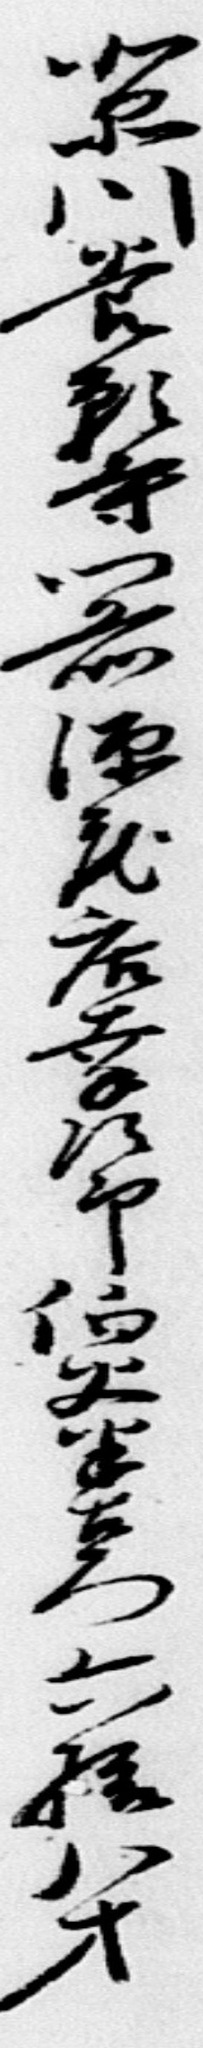北品川養願寺門前源蔵店幸次郎伯父半右衛門
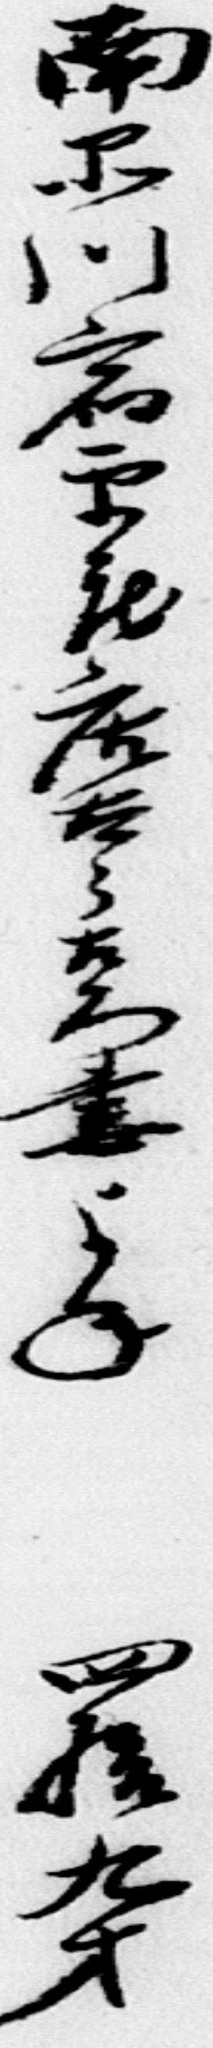南品川宿平蔵店太郎右衛門妻よね四拾九才
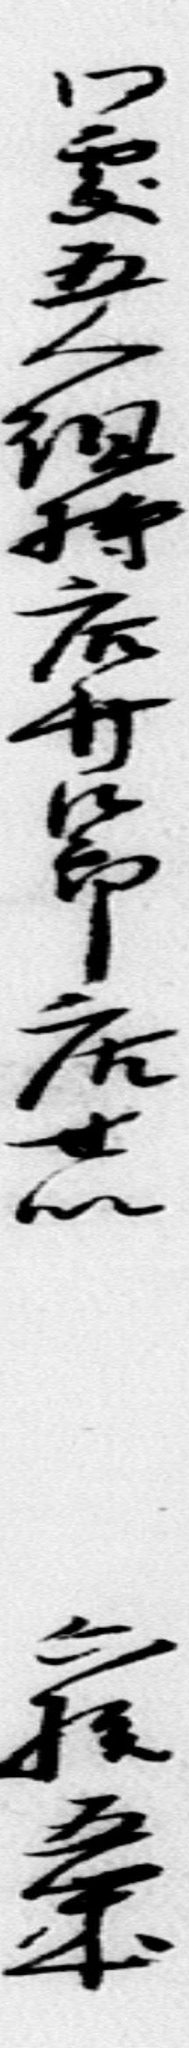同処五人組持店竹次郎店せい六拾五歳
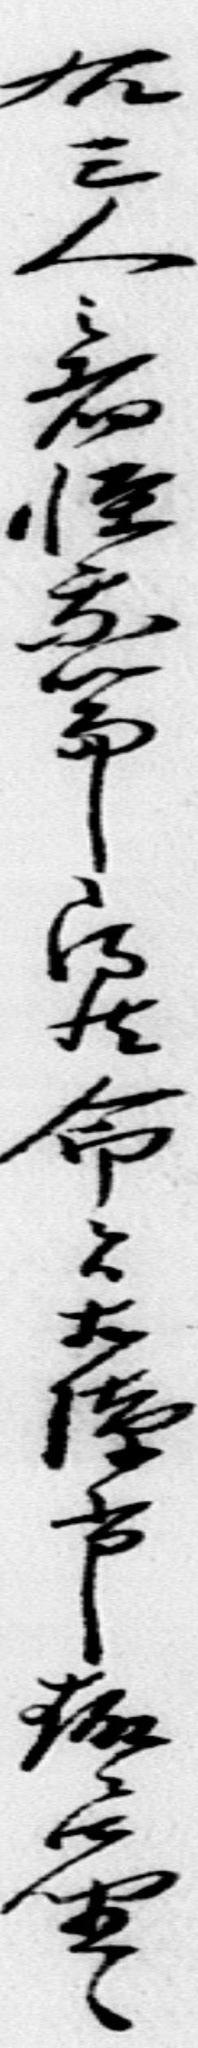右三人之者怪我いたし候得共命には相障不申趣に御座候
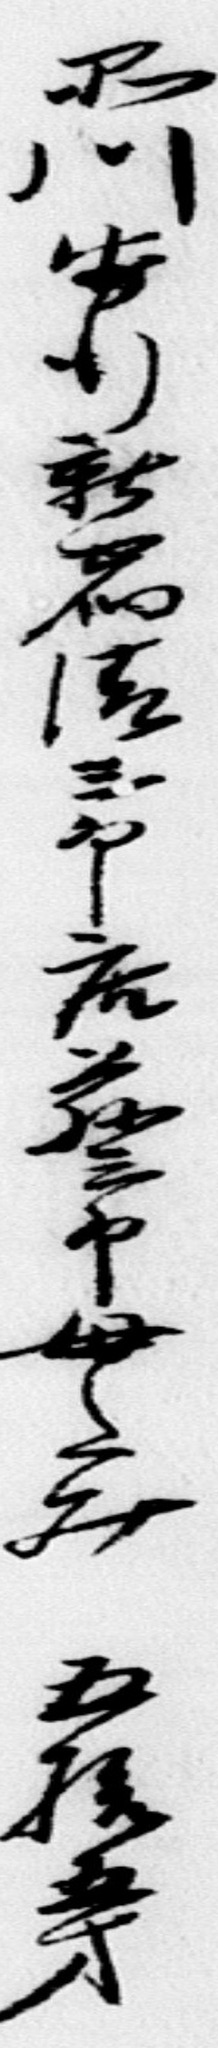品川歩行新宿清三郎店藤三郎母たみ五拾五才
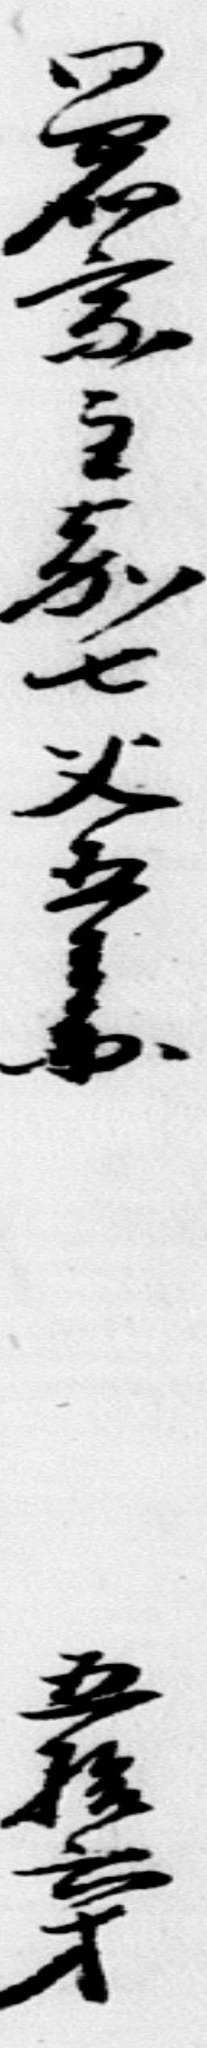同宿家主嘉七父五兵衛五拾六才
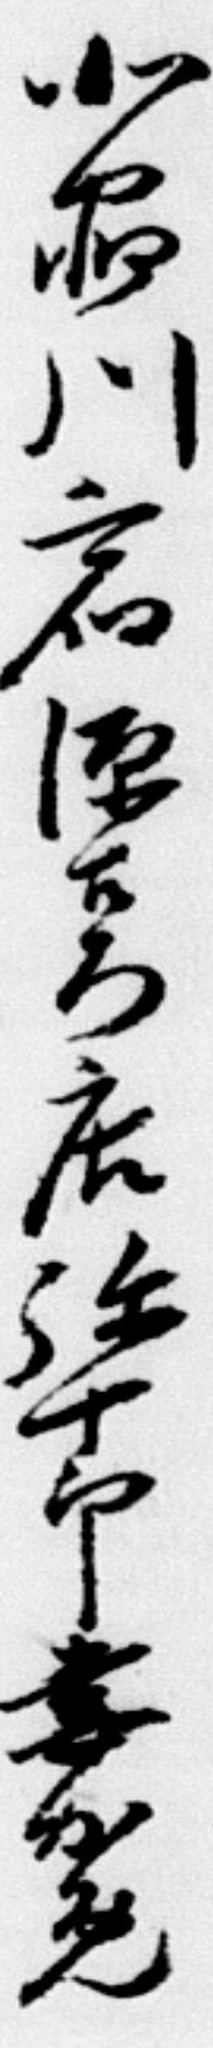北品川源左衛門店弥十郎妻かめ四拾八才
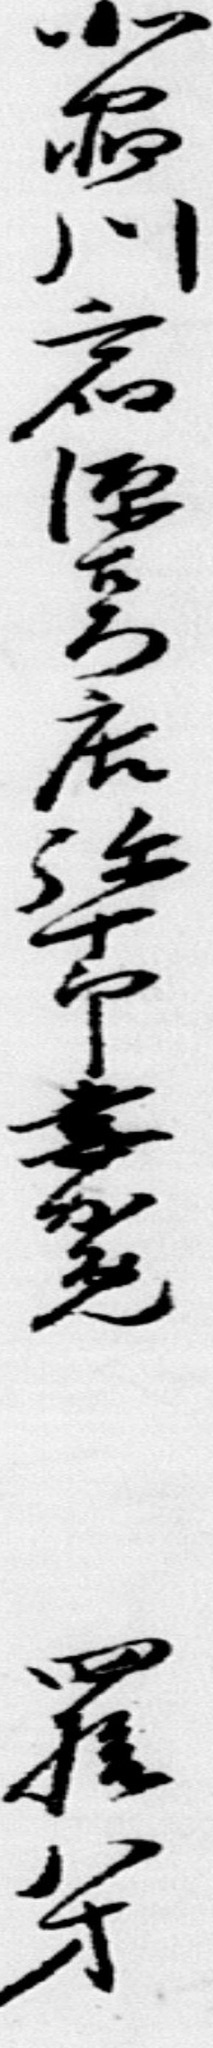北品川源左衛門店弥十郎妻かめ四拾八才
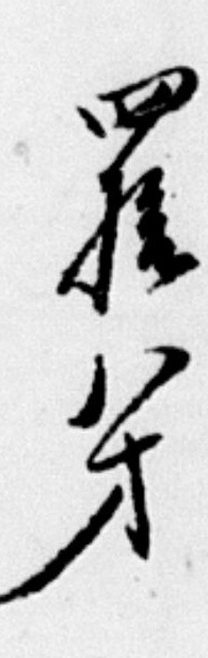六拾八才
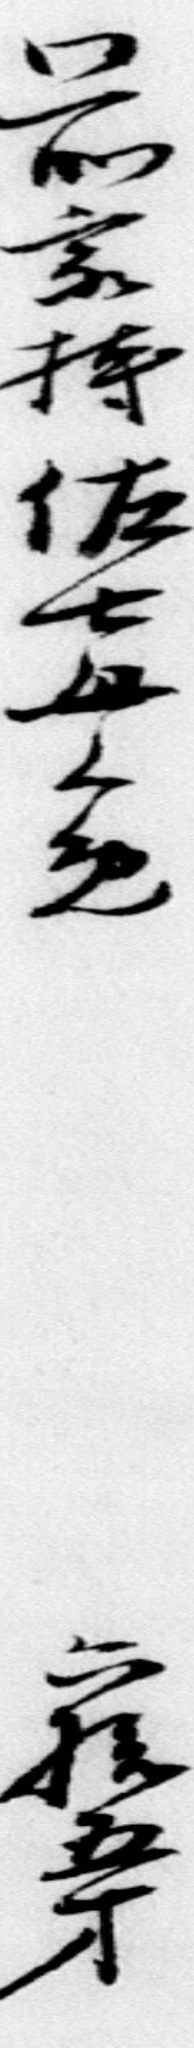同所家持佐七母くめ六拾五才
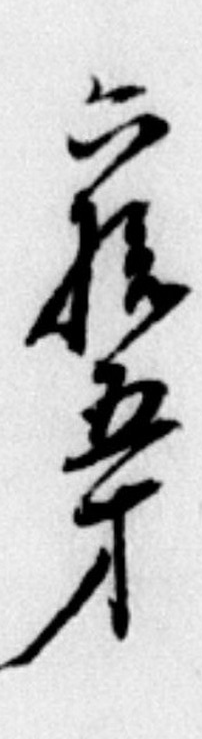六拾八才
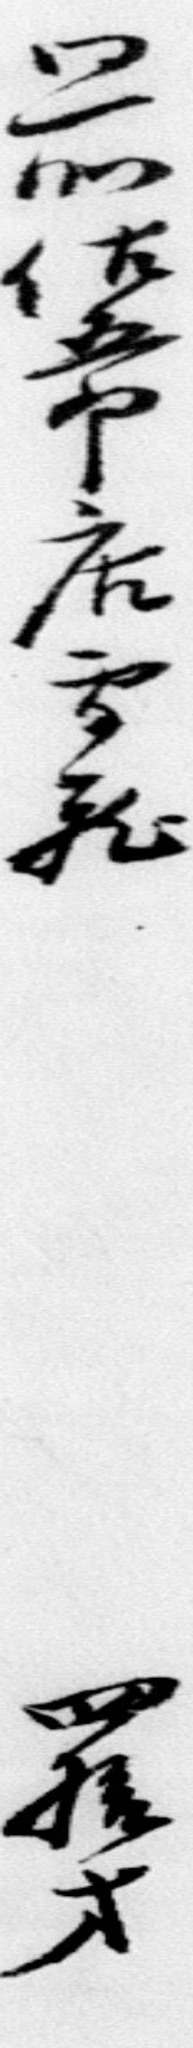同所佐五郎店専蔵四拾才
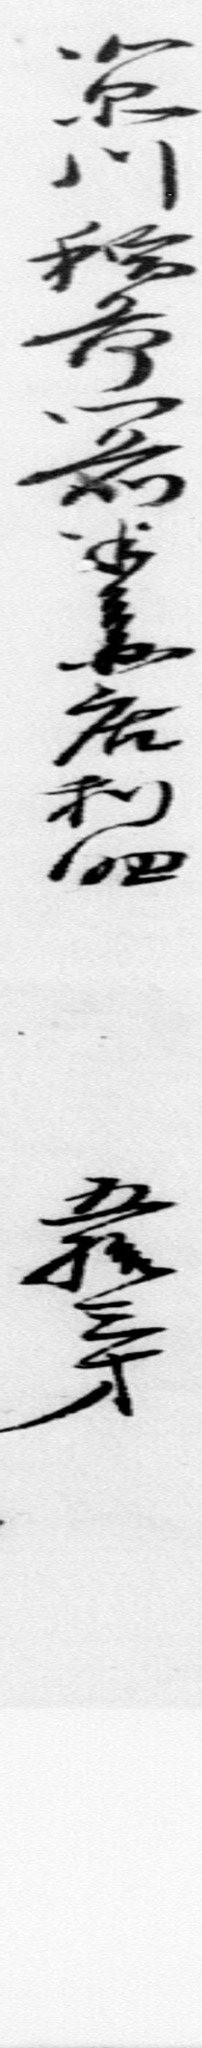北品川稲荷門前半兵衛店利助五拾三才
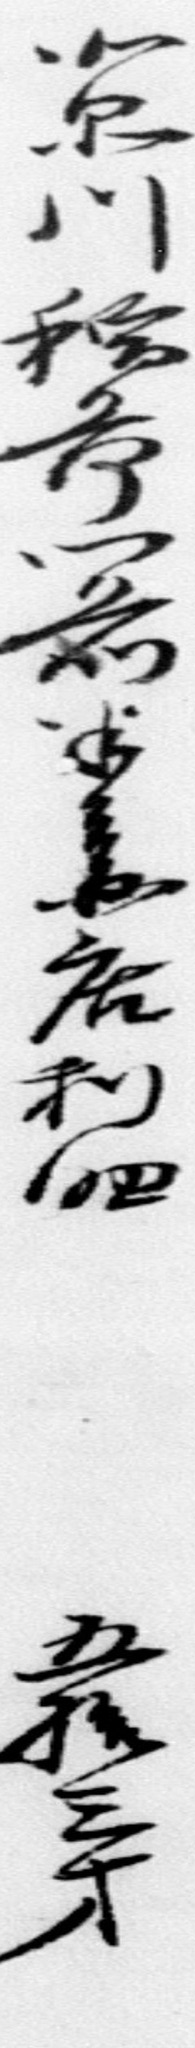北品川稲荷門前半兵衛店利助五拾三才
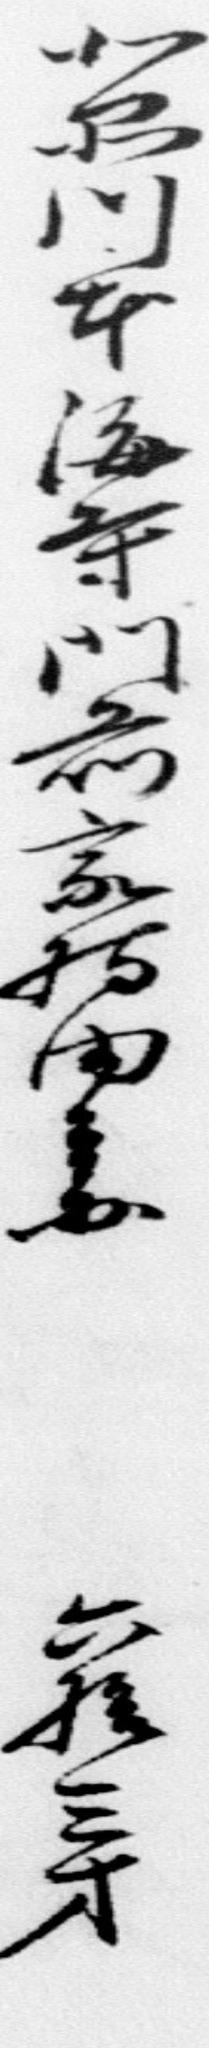北品川本海寺門前家持由兵衛六拾三才
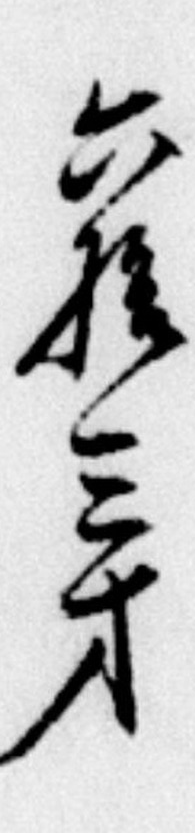六拾八才
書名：信州大地震一件
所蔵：徳島県立図書館
